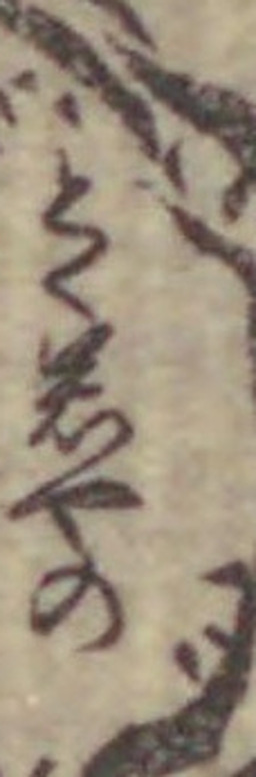とく若やの
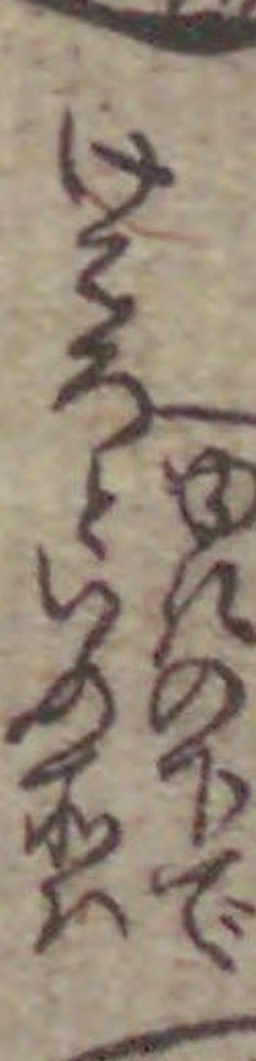けころといふ所は
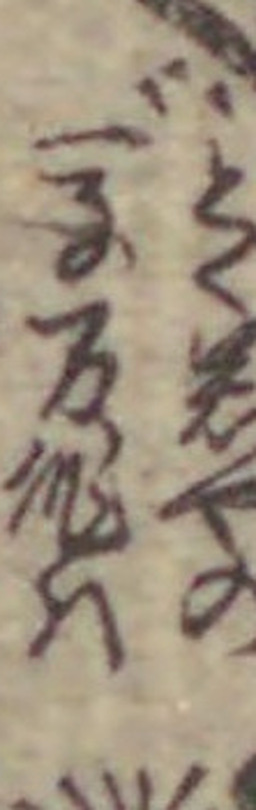一子万作は
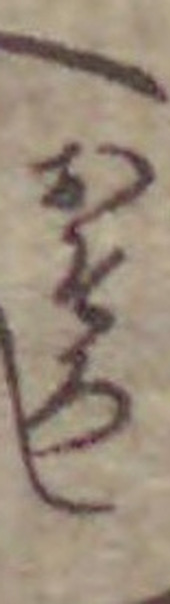おそろし
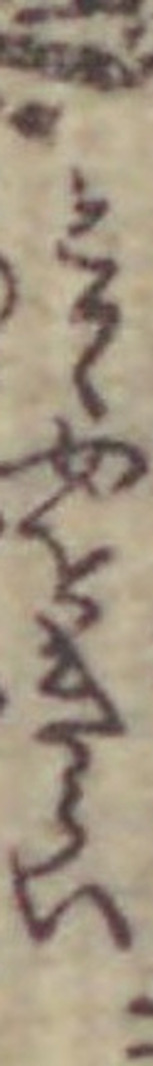とかく女をきらい
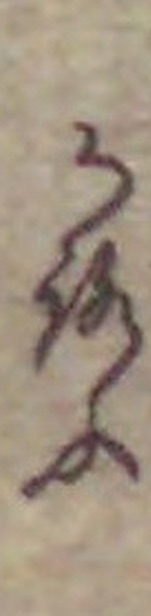かろふ
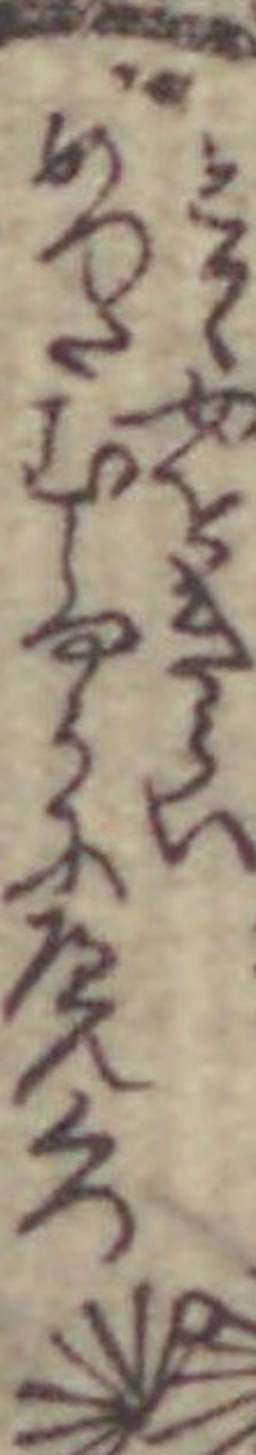めつたむしやうにへんくつ
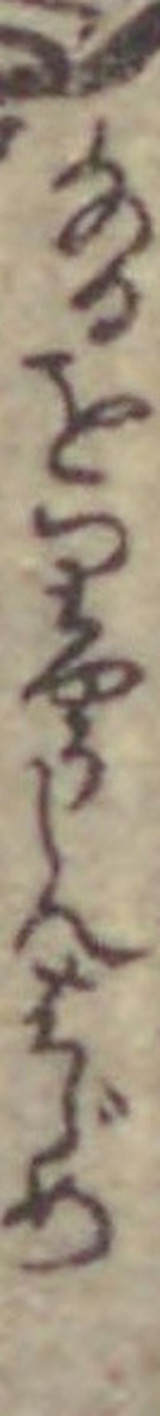なるをりようしんはぢめ
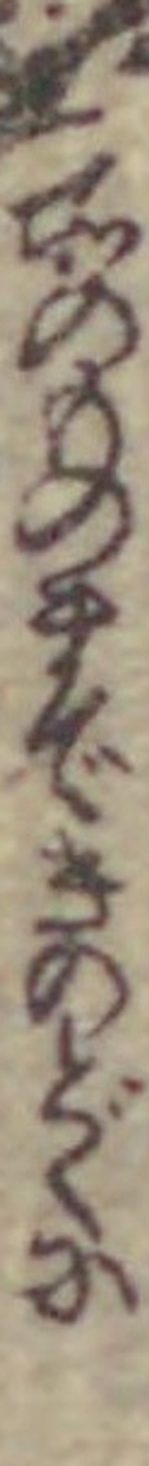所のものまできのどくに
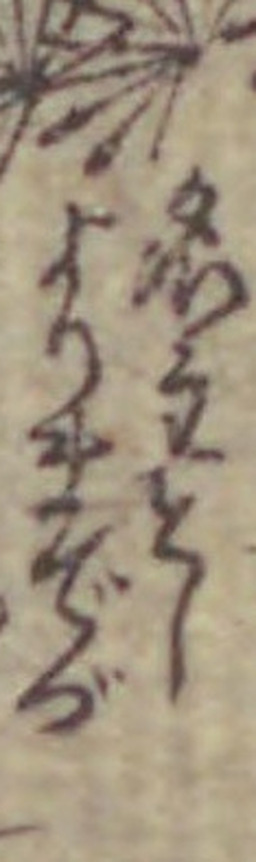よりまでが
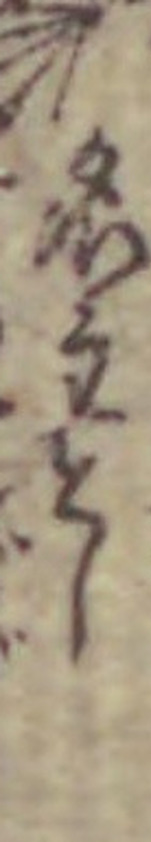名主とし
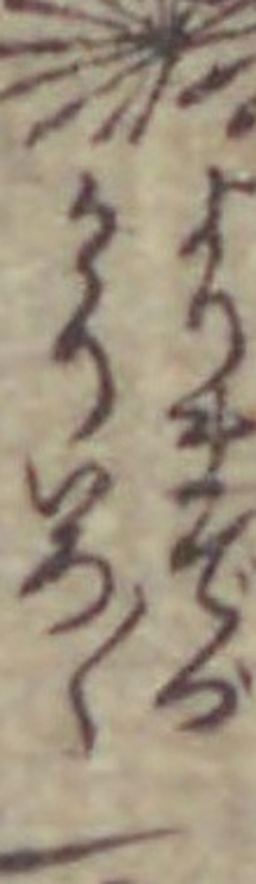かゝりいろ〳〵
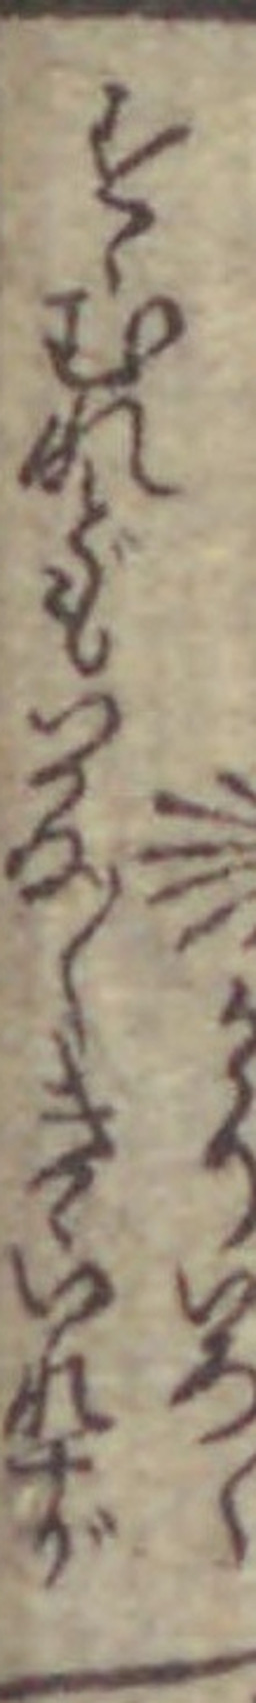すゝむれどもいかな〳〵きゝいれず
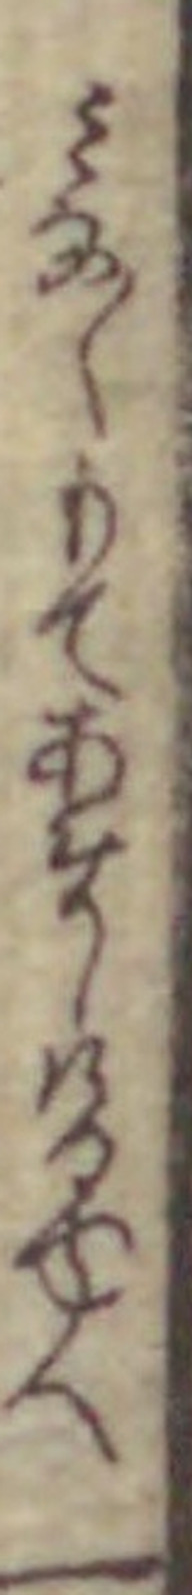みな〳〵もてあましけるゆへ
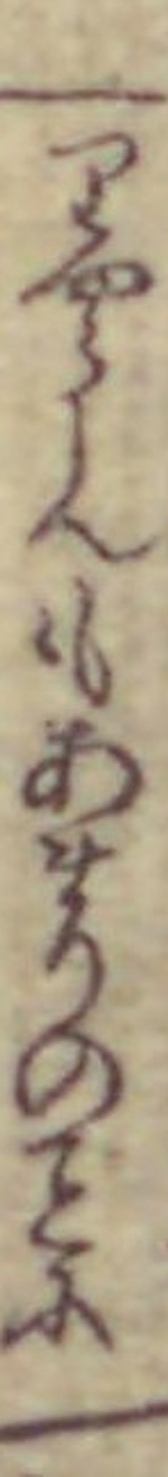りやうしんもあまりのことに
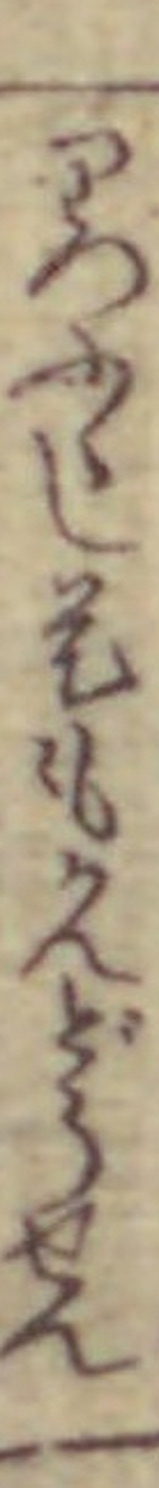りつふくし是もかんどうせん
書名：止而道致虚録 3巻
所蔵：国立国会図書館 National Diet Library, JAPAN
